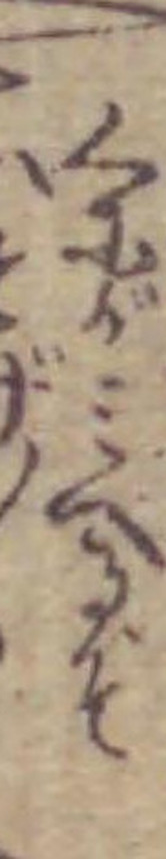くにがみへるぞ
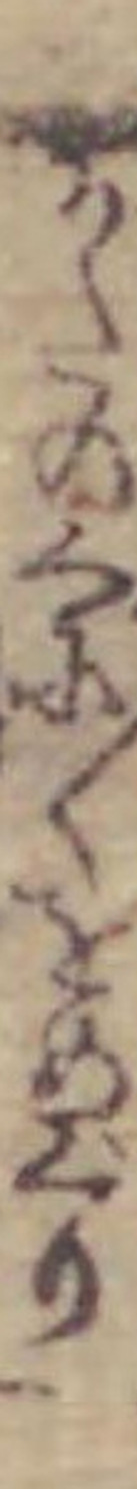かたのくに〳〵をめぐり
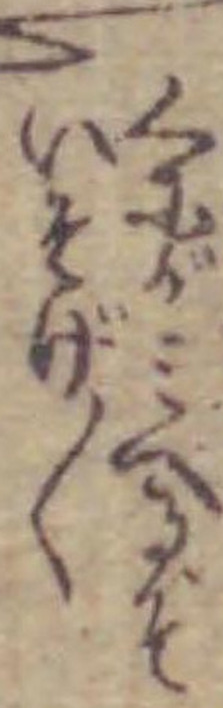いそげ〳〵
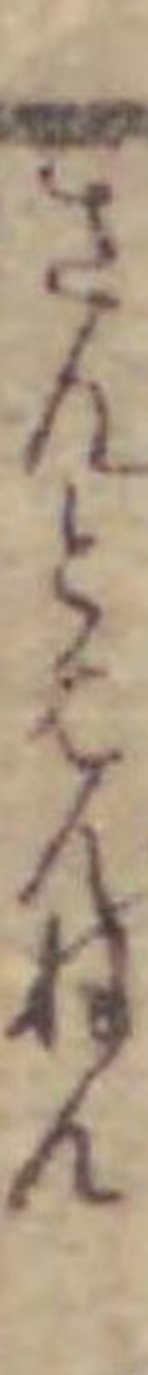さんとはんねん
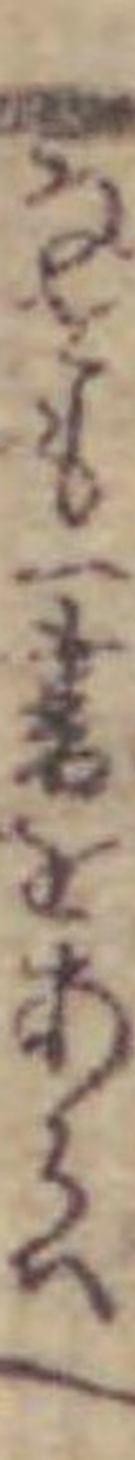なをも一書をあらは
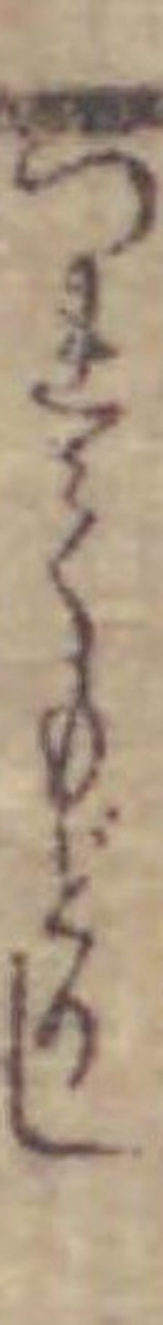つれてもどりし
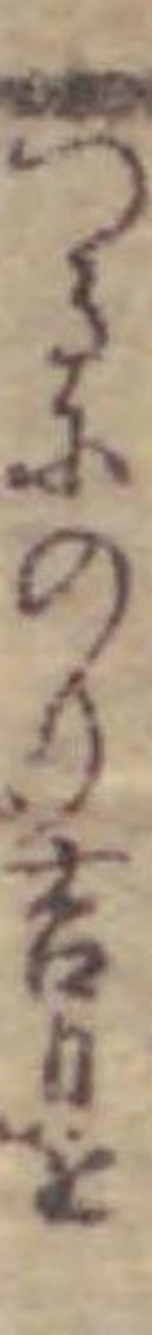つるにのり吉日を
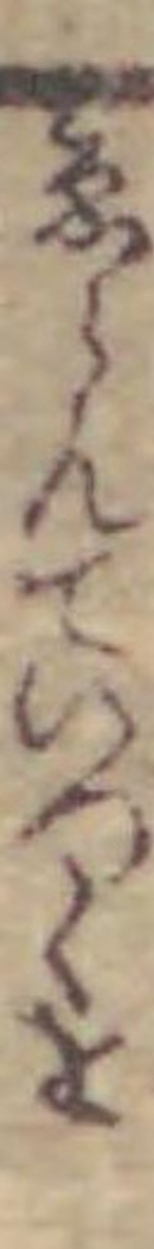ゑらんていづくを
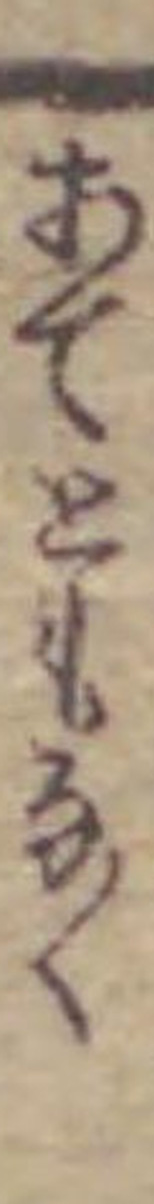あてともなく
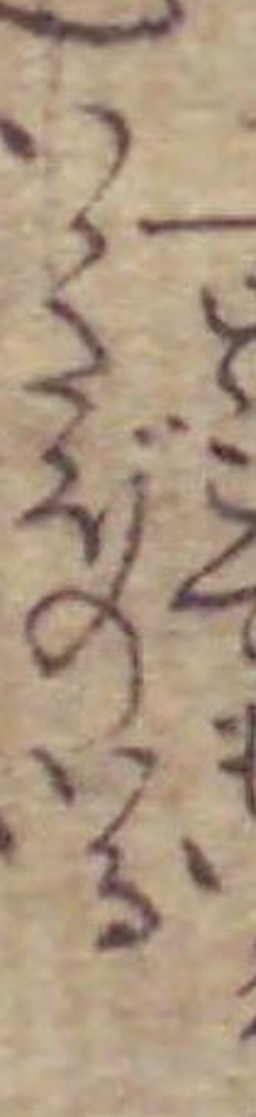いゝたぼのいる
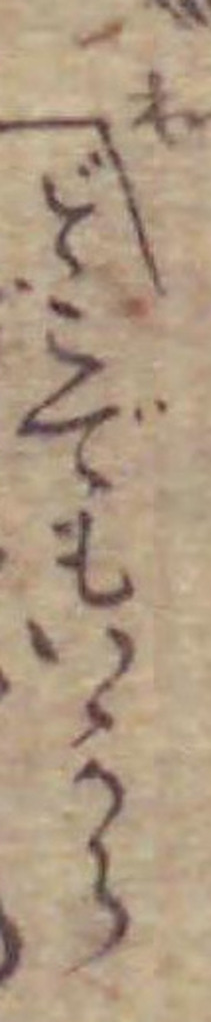〽どこでもいゝから
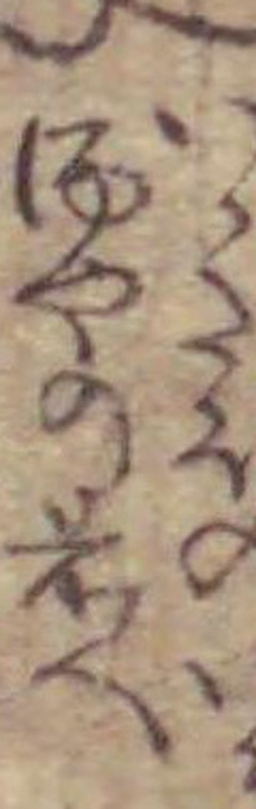酒やの前へ
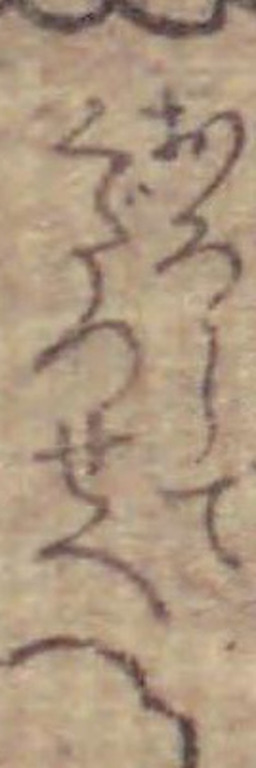くだつせへ
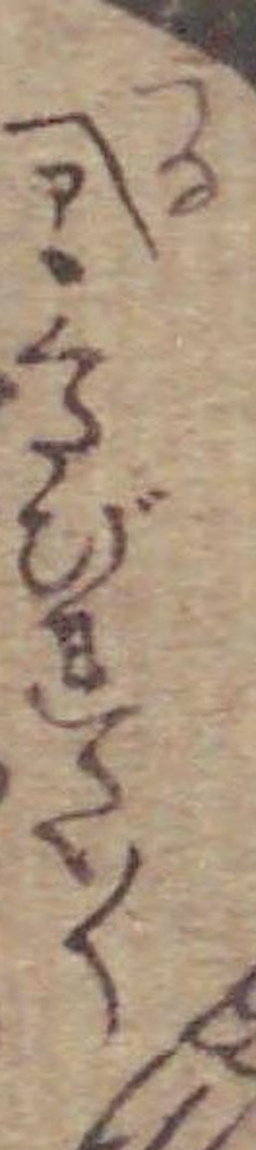〽アヽくたびれた〳〵
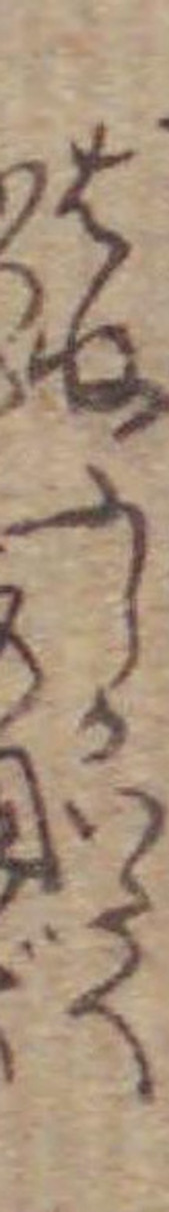はねふしかいたく
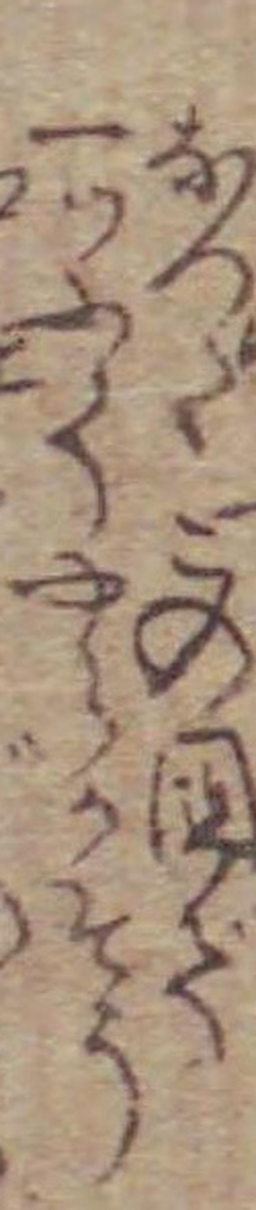一ッふろやらかそう
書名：和荘兵衛後日話 : 3巻
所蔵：国立国会図書館 National Diet Library, JAPAN
